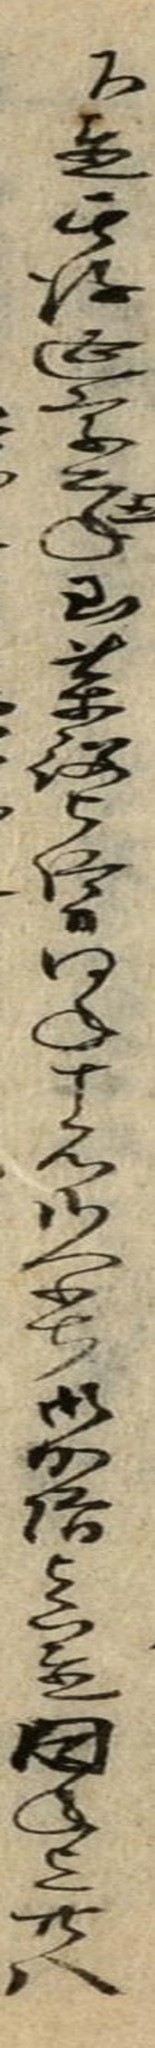下置其後延享二丑年玉薬役被仰付同年十石弐人ふち御加増被下置同年迄廿八
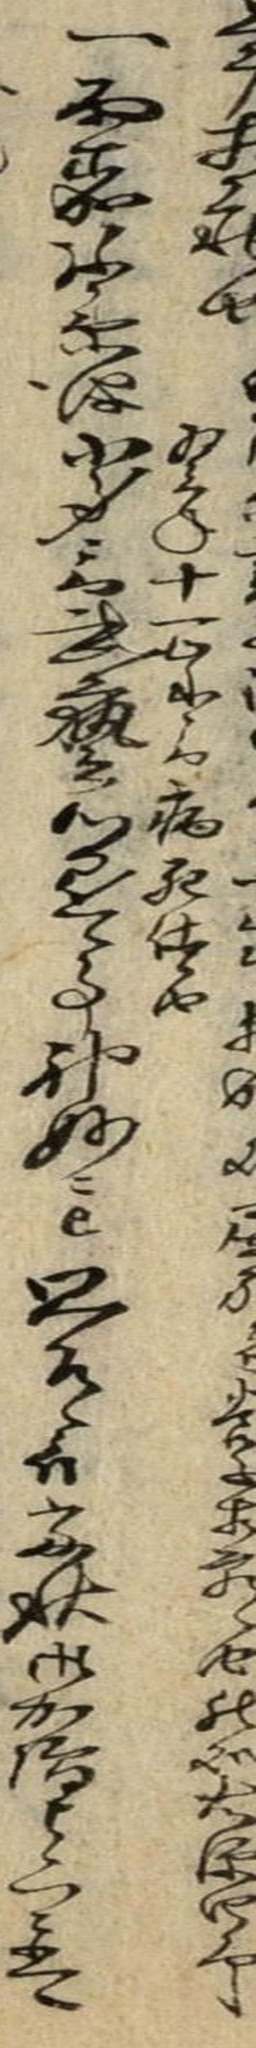一雨森弥兵衛儀小身ニ而武芸心懸候事神妙ニ被思召候ニ付当秋御加増被下置候
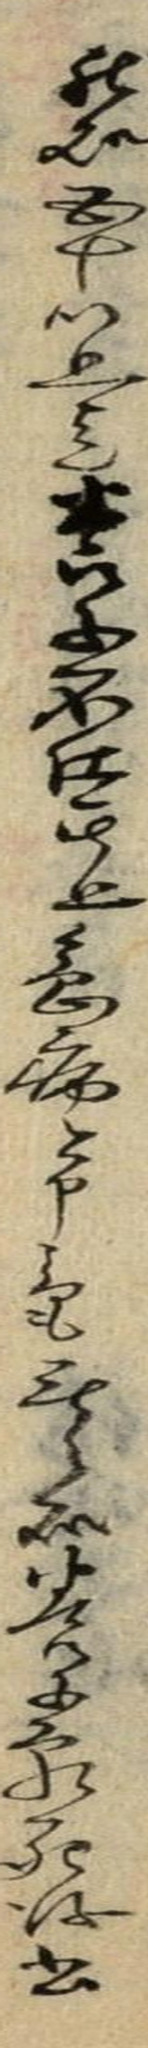然処五十以上迄養子不仕其上急病と申ニ而も無之処養子願死後書
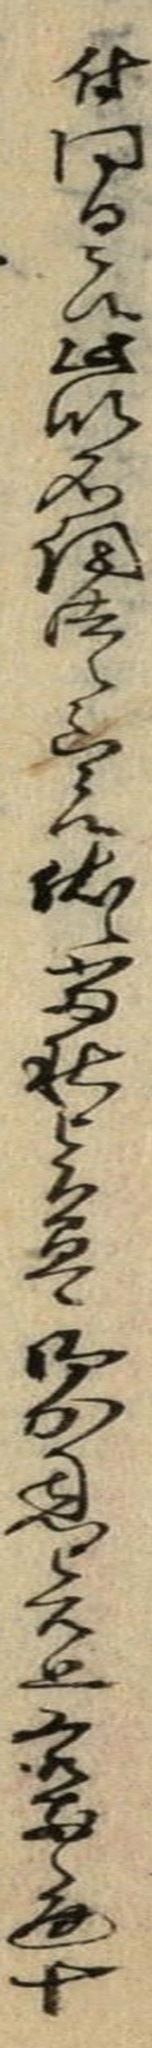付同日ニ候此段不調法之至ニ候依之当秋被下置候御加恩被召上最前之通十
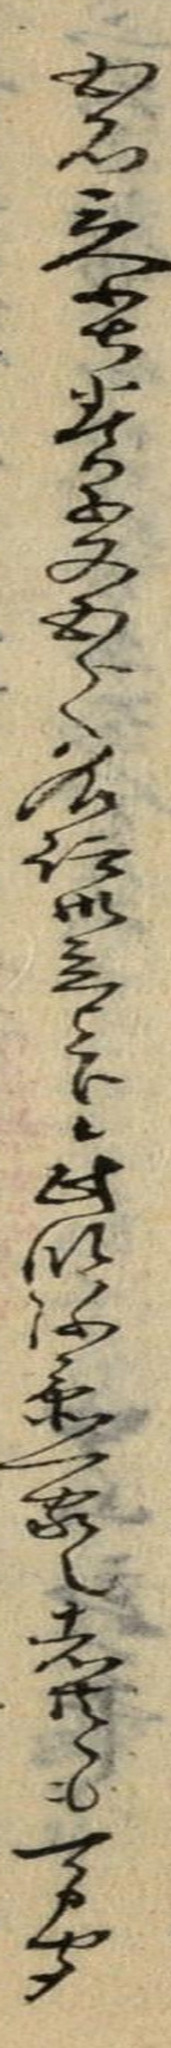五石三人ふち養子又五郎へ名跡御立被下候此段弥兵衛一家之者共へも可申聞
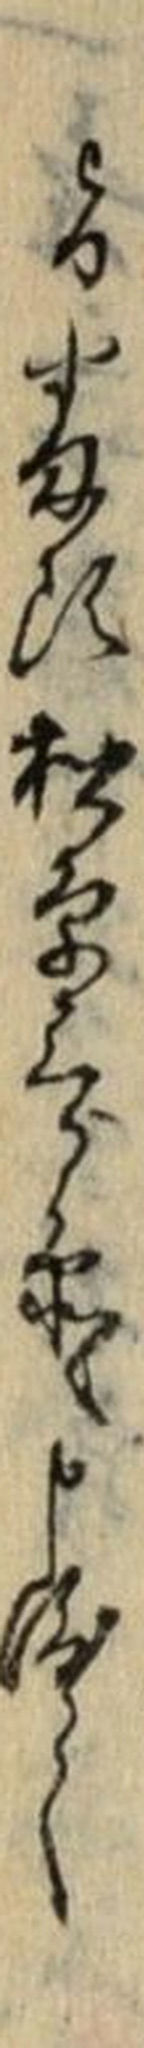旨番頭松原三郎兵衛へ申渡之
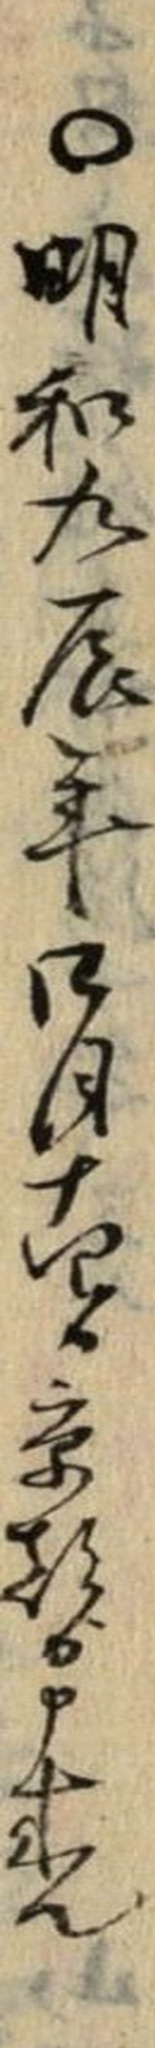〇明和九辰年四月十四日京都ゟ申来ル
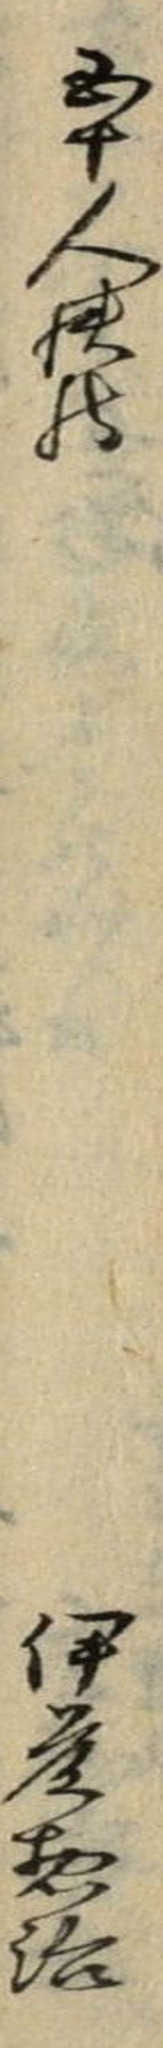五十人扶持伊藤惣治
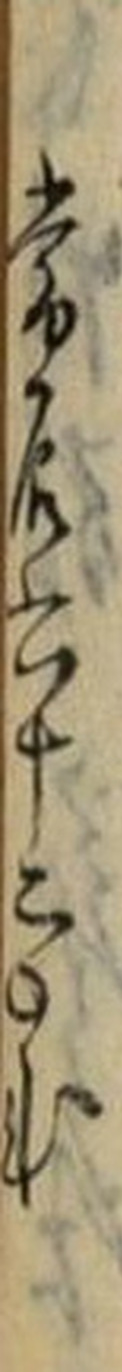当辰六十二歳
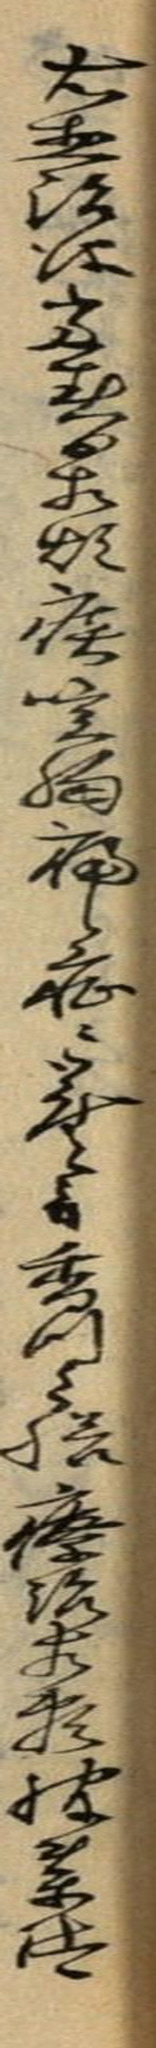右惣治儀当春ゟ相煩疾咳胸痛之症ニ御座候ニ付香川主膳療治相頼服薬仕候
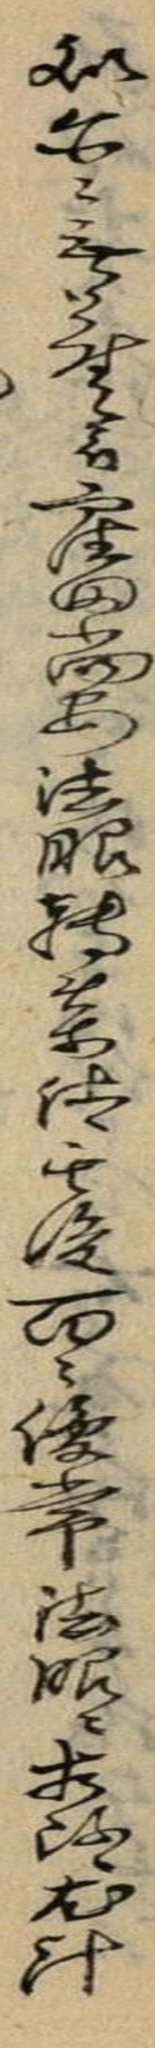処爾々無御座候ニ付窪田尚安法眼転薬仕候其後百々俊常法眼ニ相改候尤針
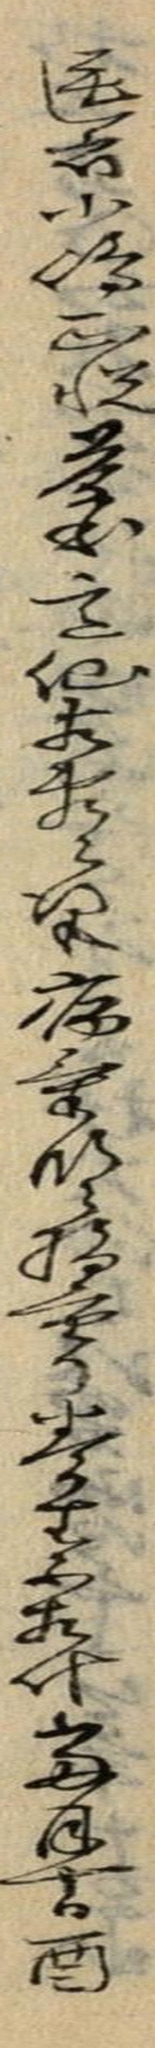医者小嶋正悦藤本意仙相頼候得共病気段々指重り養生不相叶当月十日酉
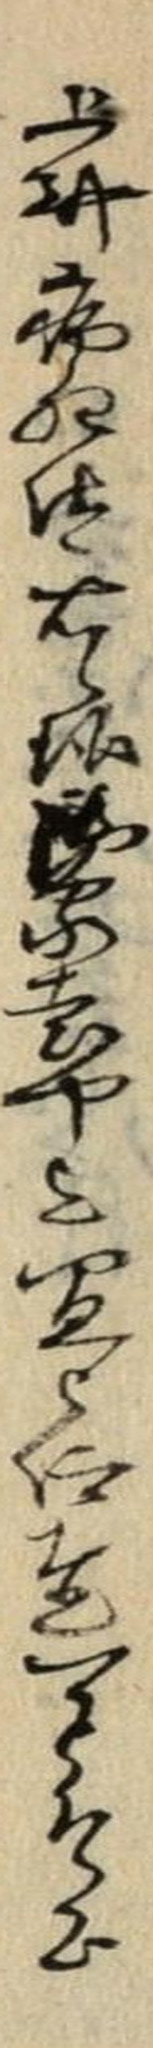上刻病死仕候右之趣御家老中迄宜被仰達可被下候以上
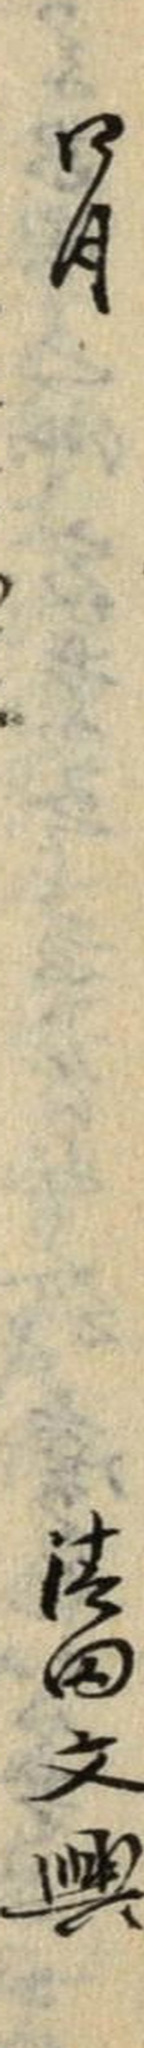四月清田文興
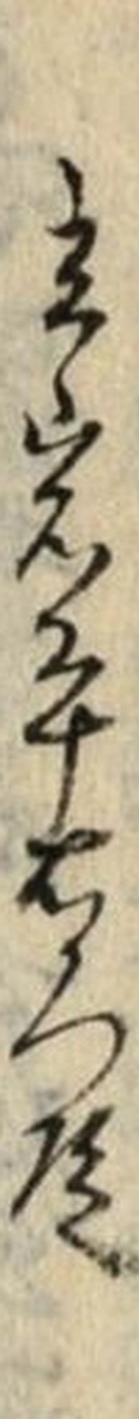立岩平右衛門殿
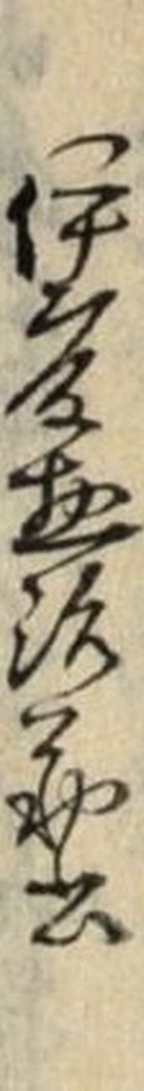伊藤惣治勤書
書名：養子縁組之部
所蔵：福井県文書館 Fukui Prefectural Archives
